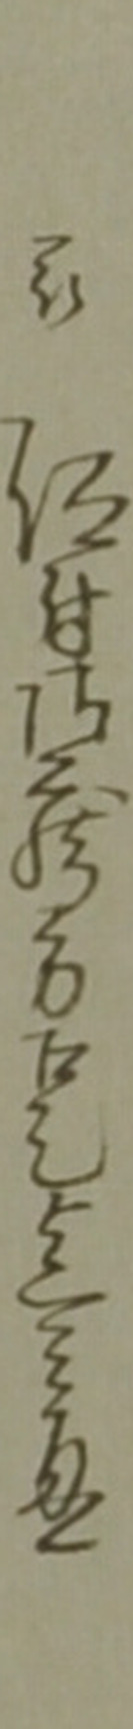被仰付御蔵方是迄之通
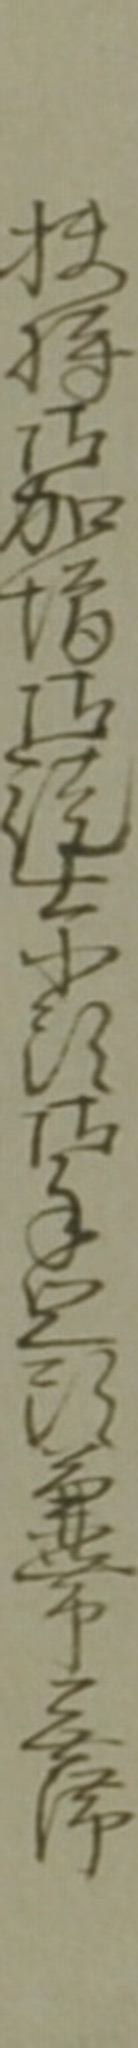扶持御加増御徒士小頭御手廻頭兼帯無滞
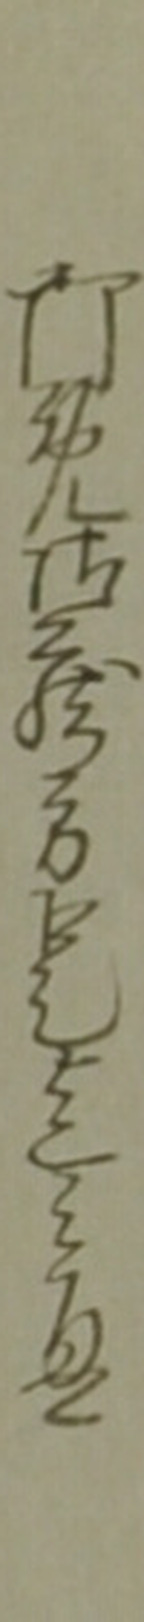御免御蔵方是迄之通
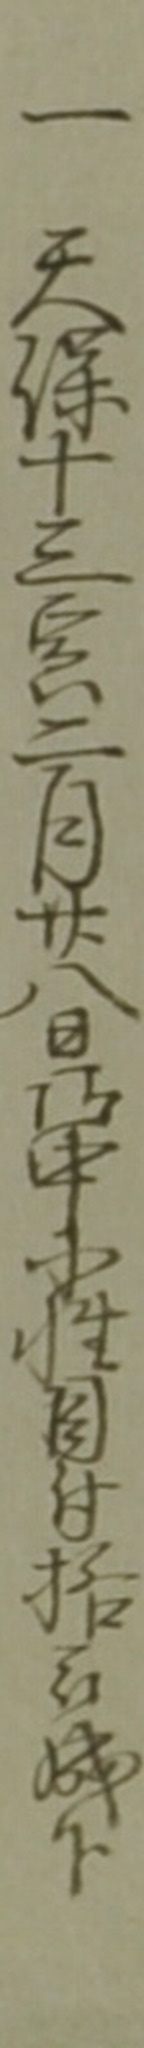一天保十三寅二月廿八日御中小性目付格被成下
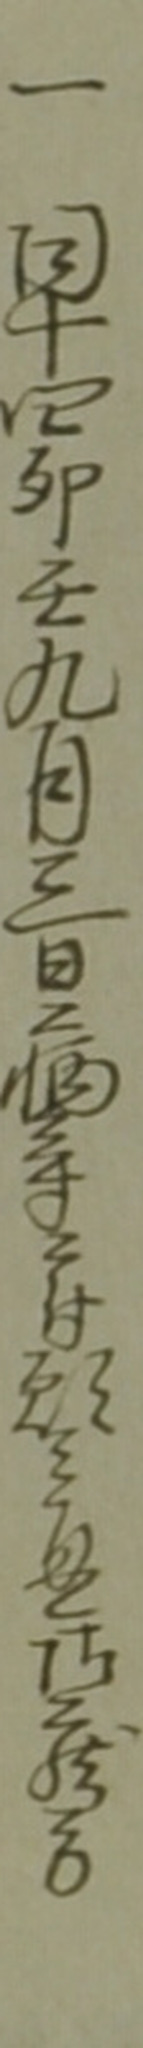一同十四卯閏九月三日病気ニ付願之通御蔵方
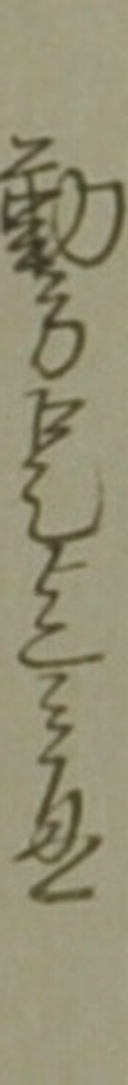勤方是迄之通

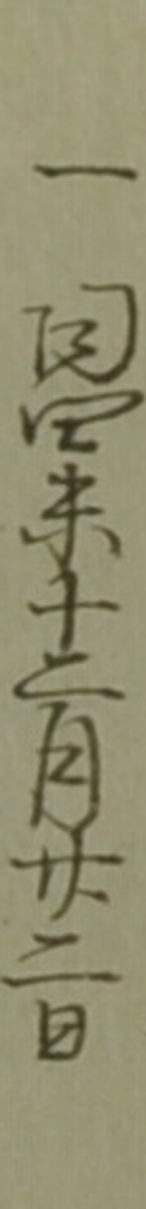一同四未十二月廿二日
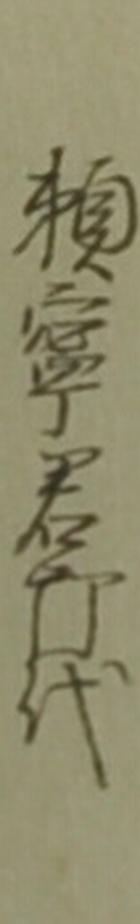頼寧君御代
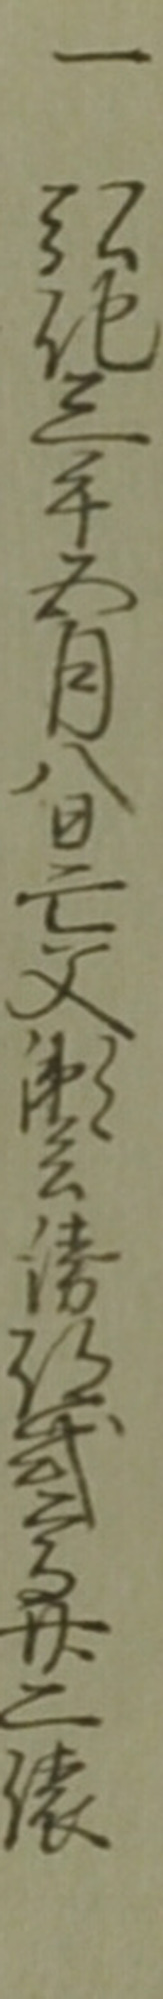一弘化三午五月八日亡父瀬兵衛跡式高廿二俵
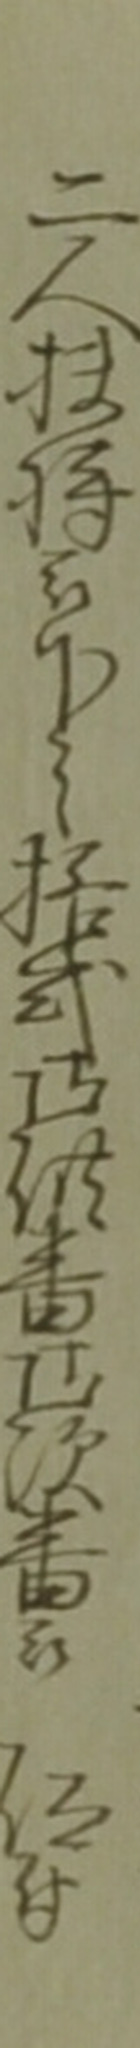二人扶持被下之格式御供番御次番被仰付
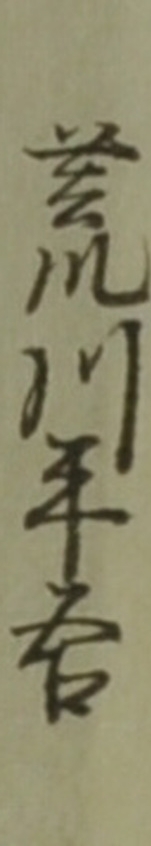荒川平吾
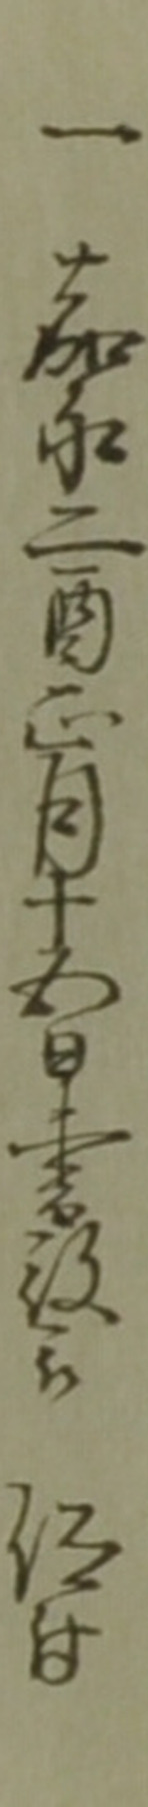一嘉永二酉正月十五日書役被仰付
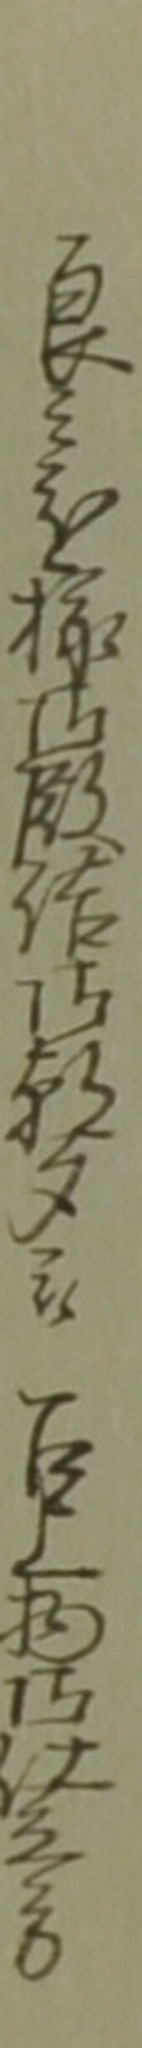良之進様御殿詰御朝夕被召上物御仕立方
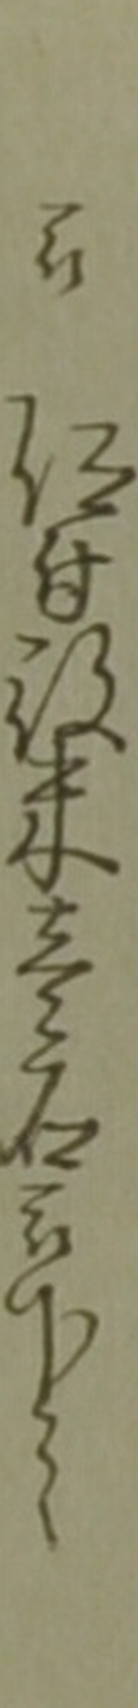被仰付役米壱石被下之

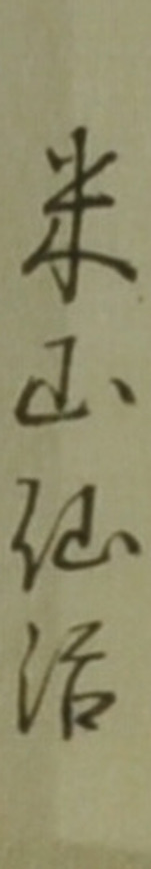米山仙治
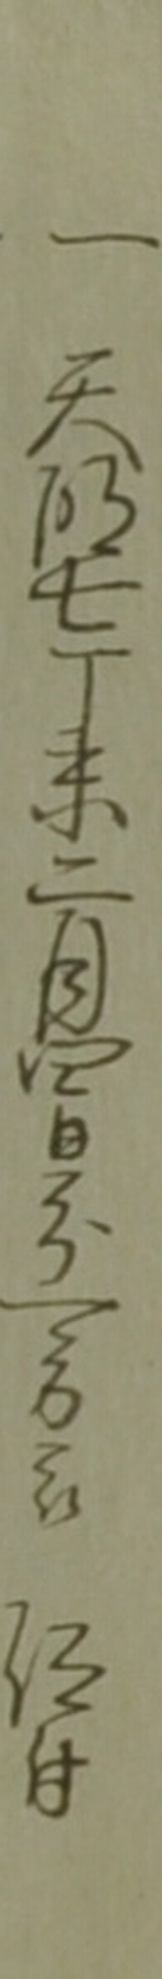一天明七丁未二月四日分一方被仰付
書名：無足諸士勤仕録（二）
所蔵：伊那市立高遠町図書館・合同会社AMANE
